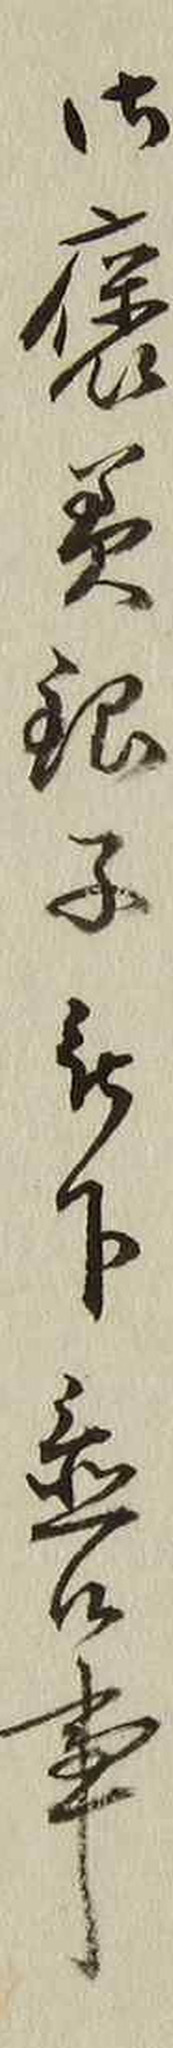御褒美銀子被下置候事
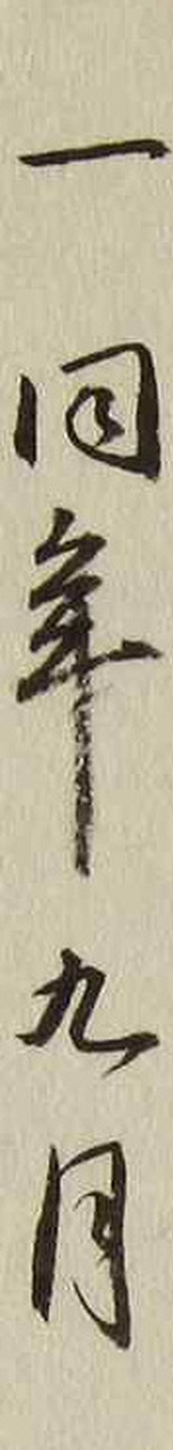一同年九月
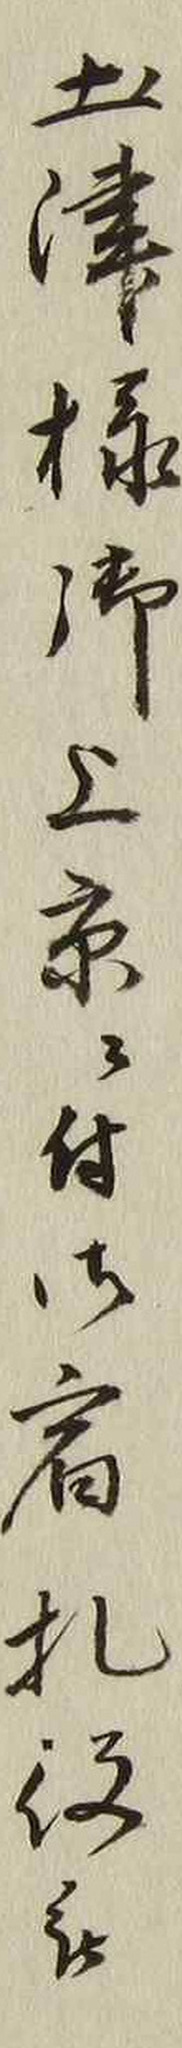土津様御上京ニ付御宿札役被
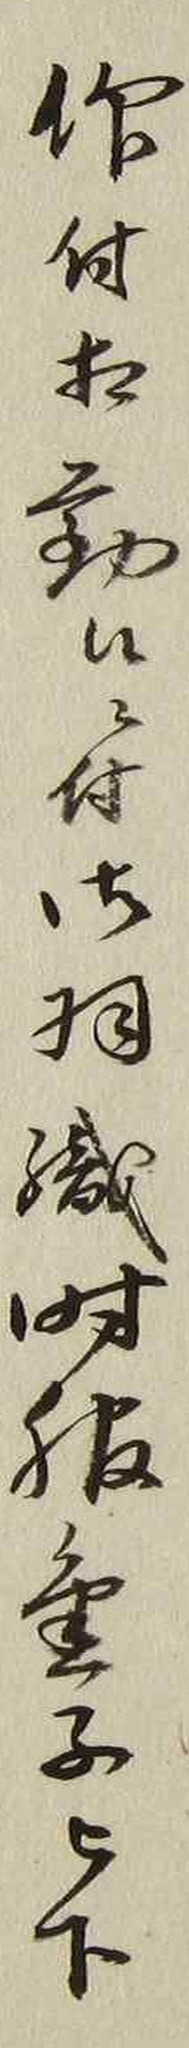仰付相勤候ニ付御羽織時服金子被下
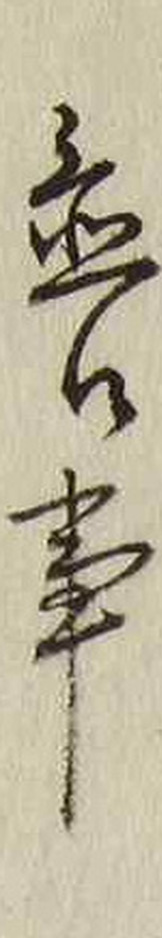置候事
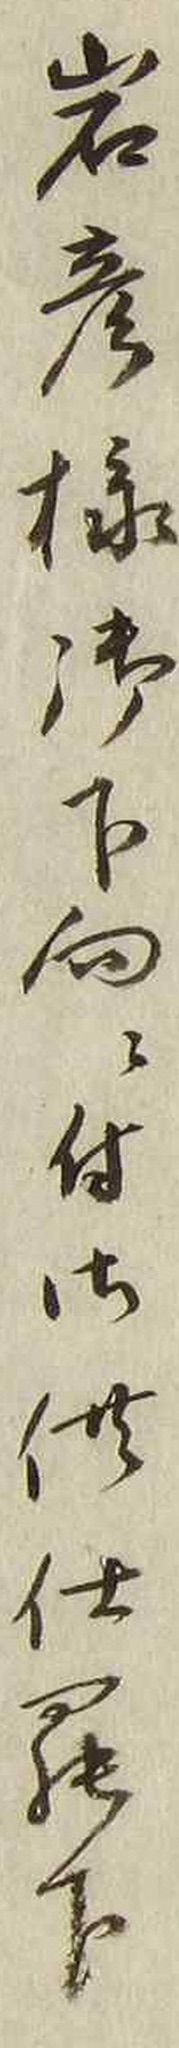岩彦様御下向ニ付御供仕罷下
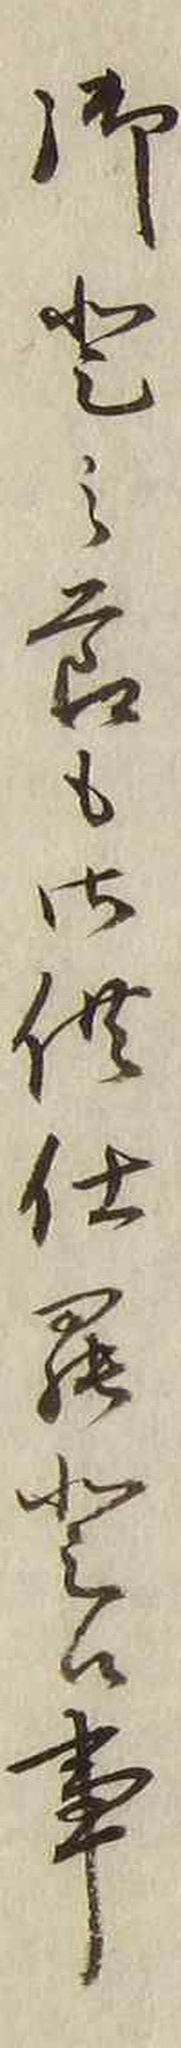御登之節も御供仕罷登候事

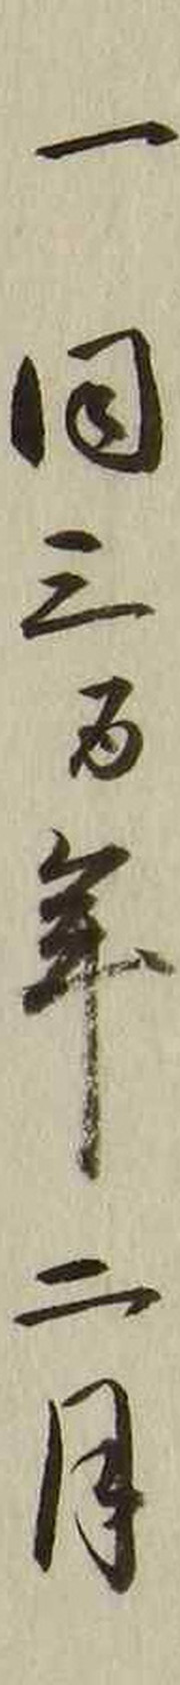一同三酉年二月
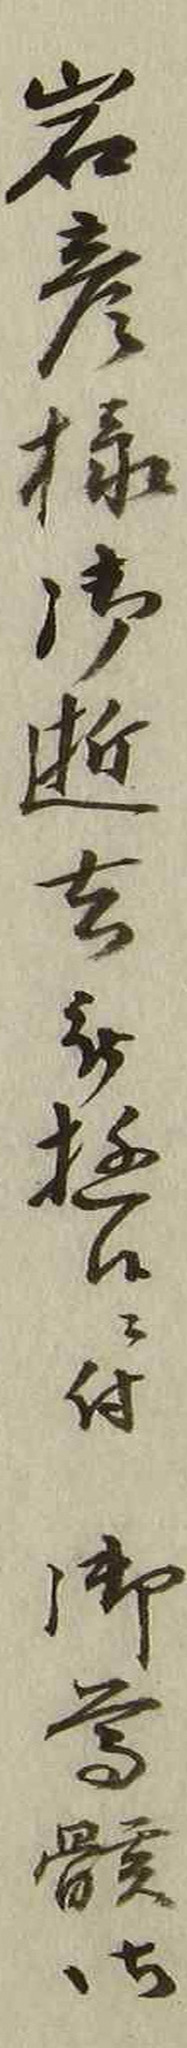岩彦様御逝去被遊候ニ付御尊骸御
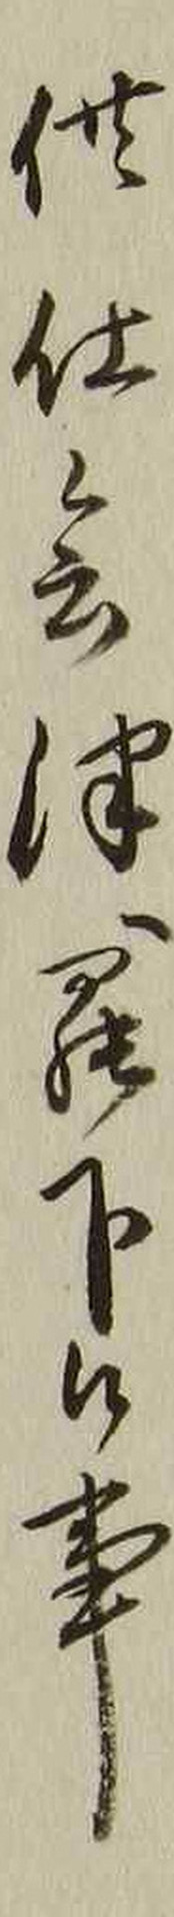供仕会津へ罷下候事
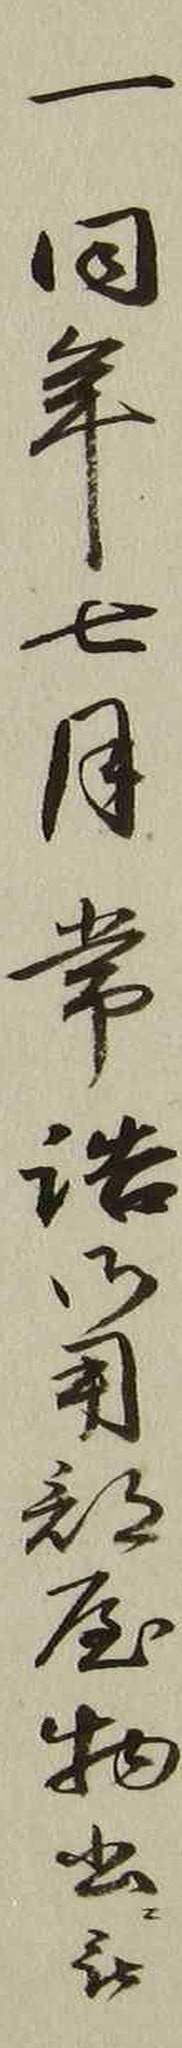一同年七月常詰御用部屋物書ニ被
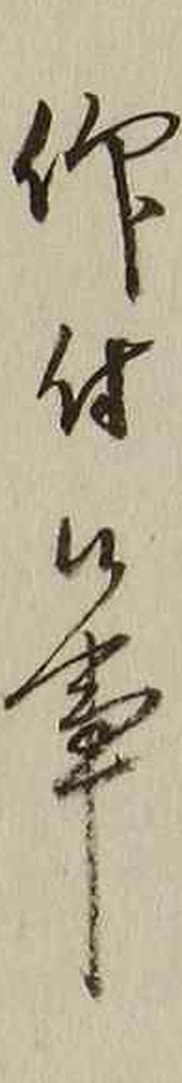仰付候事
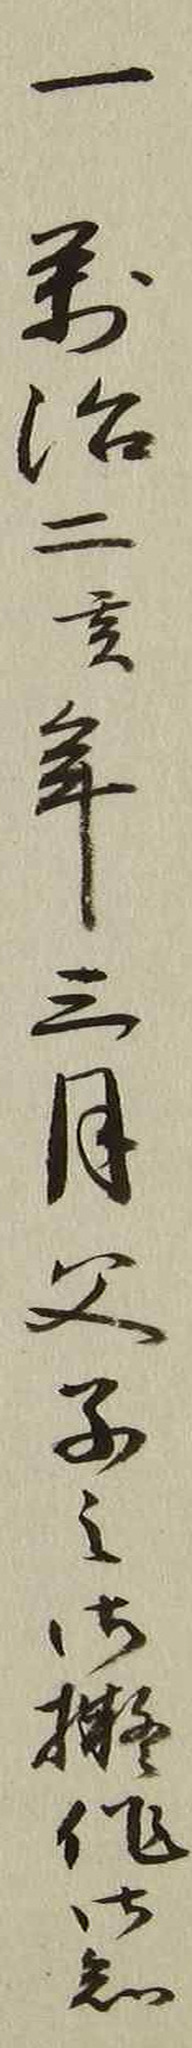一万治二亥年三月父子之御擬作御知
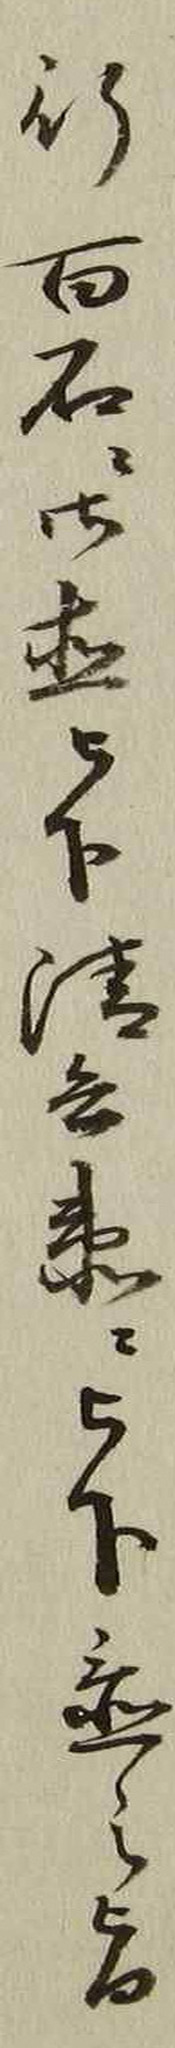行百石ニ御置被下清兵衛ニ被下置之旨
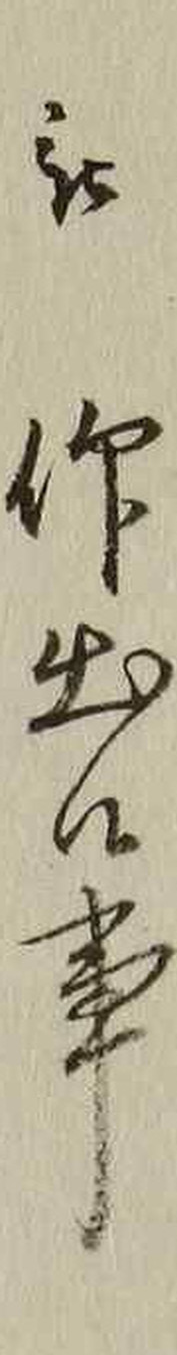被仰出候事
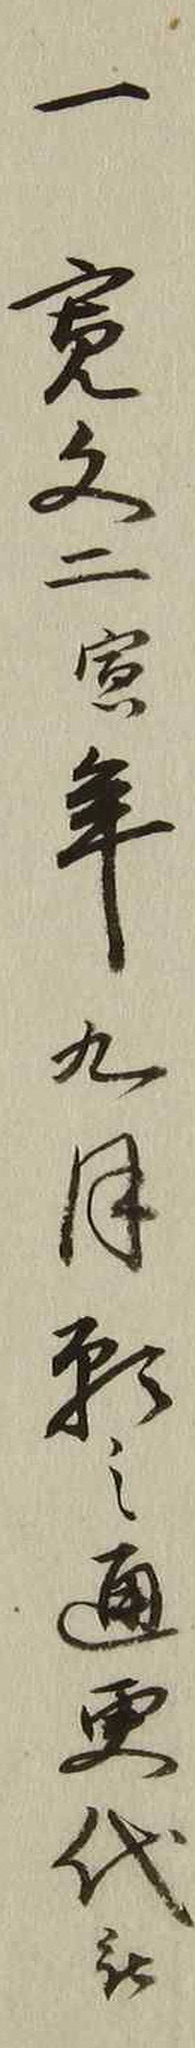一寛文二寅年九月願之通更代被
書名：諸士系譜　巻之128　た之部4
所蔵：会津若松市立会津図書館
